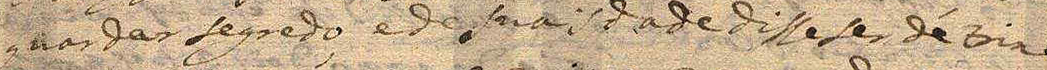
guardar segredo, e de sua jdade disse ser de trin
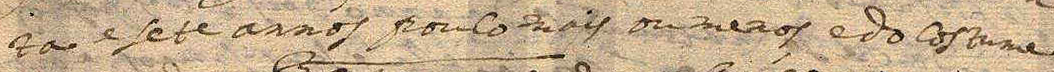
ta e sete annos pouco mais ou menos, e do costume
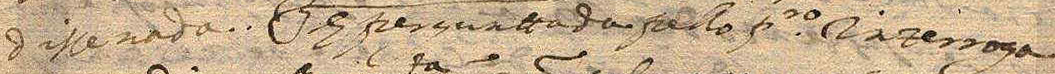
disse nada. item E pergunttada pello pro. Interroga
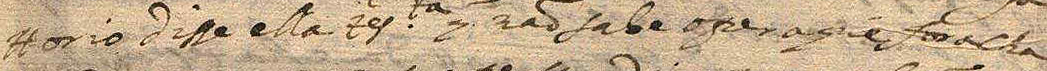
ttorio disse ella test.ta q̄ não sabe o pera que fora cha
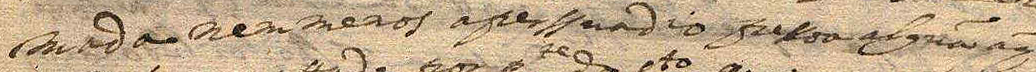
mada, nem menos a perssuadio pessoa alguā a q̄
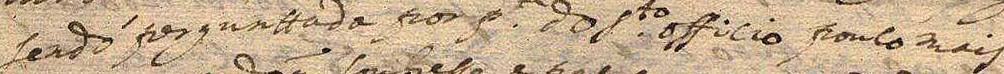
sendo pergunttada por p.te do S.to officio pouco mais
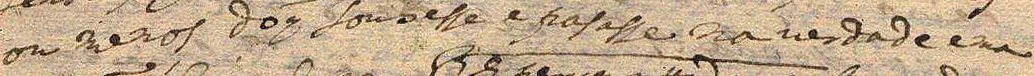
ou menos, do q̄ soubesse e pasasse na uerdade e ma
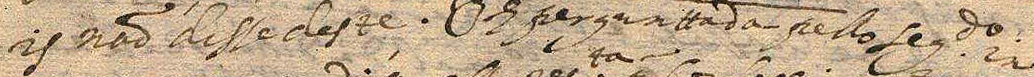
is não disse deste. item E pergunttada pello seg.do in
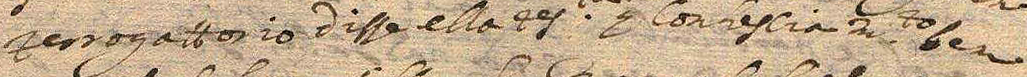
terrogattorio disse ella tes.ta q̄ Conhescia m.to bem
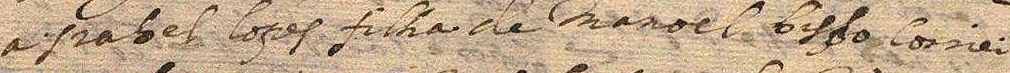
a Jzabel lopes, filha de Manoel bispo Corriei
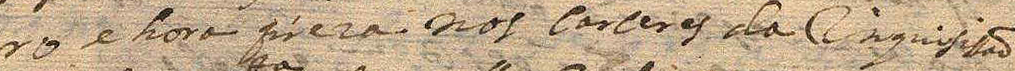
ro, e hora preza nos carceres da Inquisissão
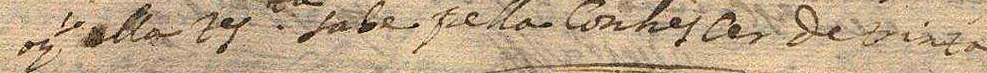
o q̄ _lla tes.ta sabe pella Conhescer de trinta
